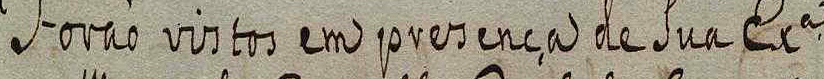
Foraõ vistos em prezença de Sua Ex.a
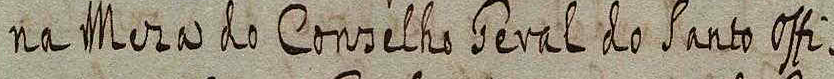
na Meza do Conselho Geral do Santo Offi
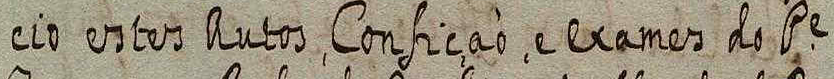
cio estes autos, Confiçaõ, e exames do P.e
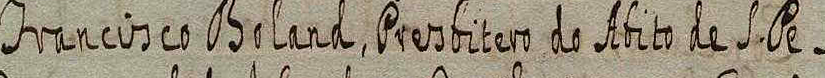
Francisco Boland, Presbitero do Abito de S. Pe
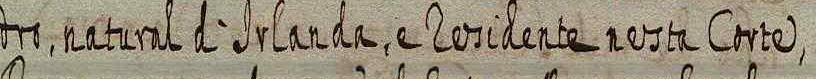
dro, natural da Irlanda, e rezidente nesta Corte,
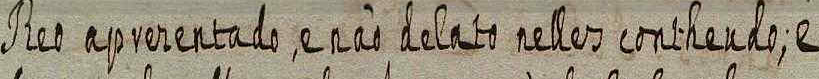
Reo aprezentado, e não delato nelles contheudo; e
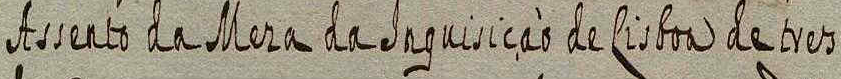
Assento da Meza da Inquiziçaõ de Lisboa de tres
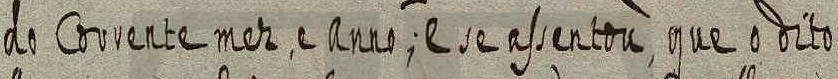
do corrente mez, e anno; e se assentou, que o dito
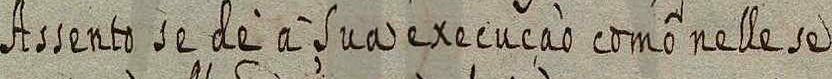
Assento se de á Sua execução como nelle se
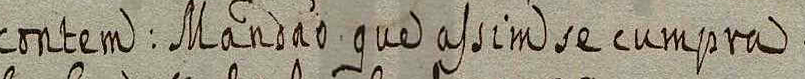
contem: Mandaõ que assim se cumpra
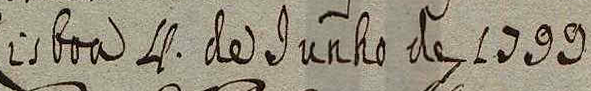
Lisboa 4 de Iunho de 1799
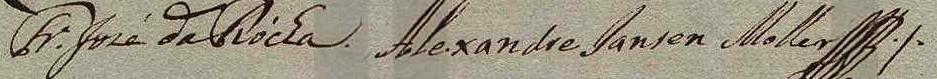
Fr. Jozé da Rocha. Alexandre Iansen Moller
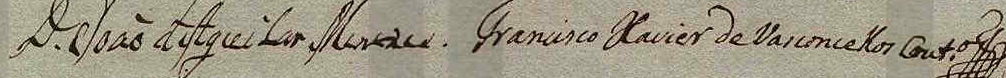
D. Joaõ d̄Aguilar Menezes. Francisco Xavier de Vasconcelos Cout.o
